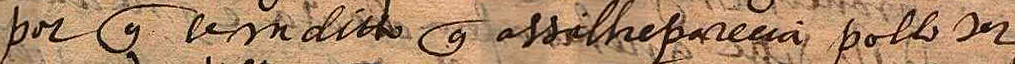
por q̄ tem ditto q̄ assi lhe parecia pollo ter
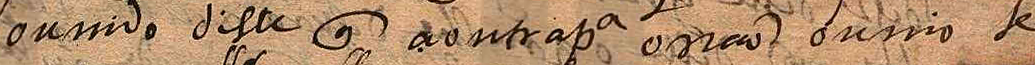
ouuido disse q̄ a outra pa o naõ ouuio se
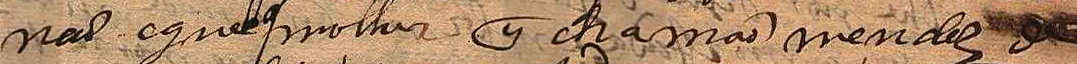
naõ aquella / molher q̄ chamaõ mendez de
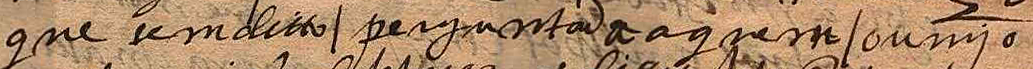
que tem ditto / perguntada a quem / ouuyo
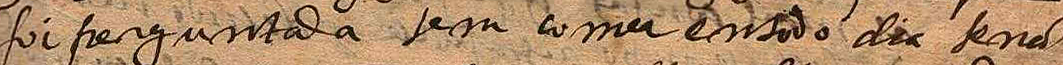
foi perguntada sem comer en todo dia senaõ
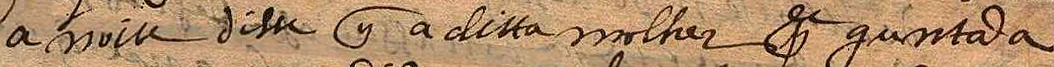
a noite disse q̄ a ditta molher p̄erguntada
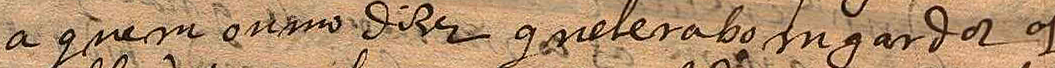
a quem ouuio dizer que hera bom gardar os
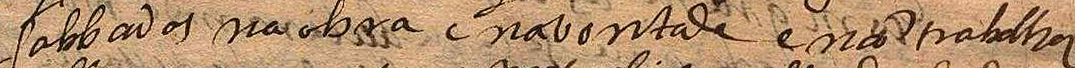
sabbados na obra e na vontade e naõ trabalhar
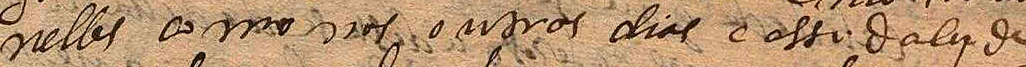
nelles como nos outros dias e assi da lej de
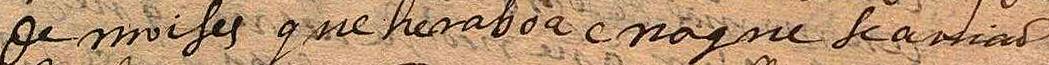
de moises que hera boa e na que se auiaõ
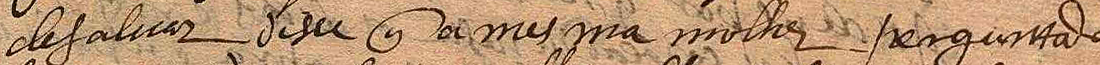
de saluar disse q̄ a mesma molher perguntada
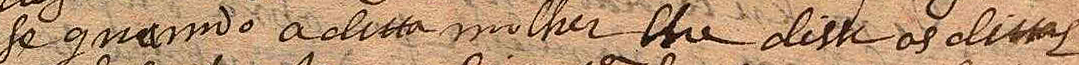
se quamdo a ditta molher lhe disse as dittas
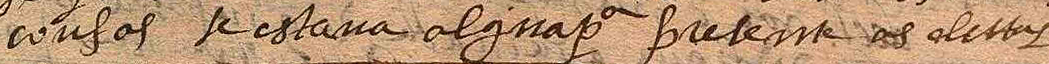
cousas se estaua algua pa presente as dittas
